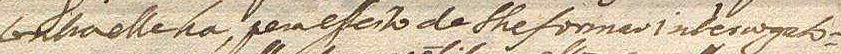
contra elle ha, pera effeito de lhe formar interrogato
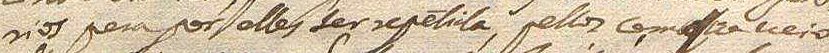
rios pera por elles ser repetida, pellos com que ueio
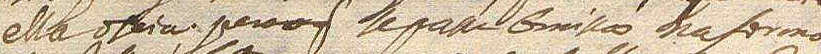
ella o seia; pera o q̄ se passe comissaõ na forma
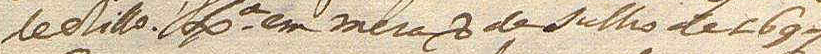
do ditto. Lxa. em meza 8 de Iulho de 1697
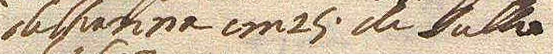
de lhanna em 25. de Iulho
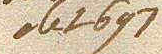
de 1697
